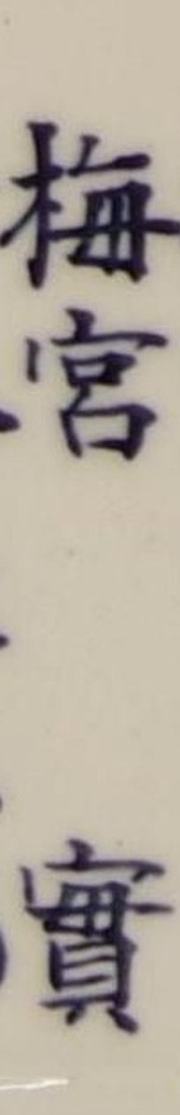梅宮實
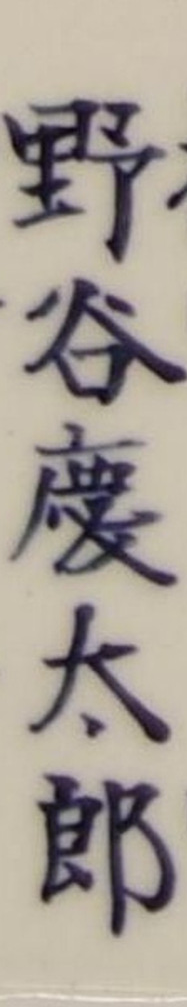野谷慶太郎
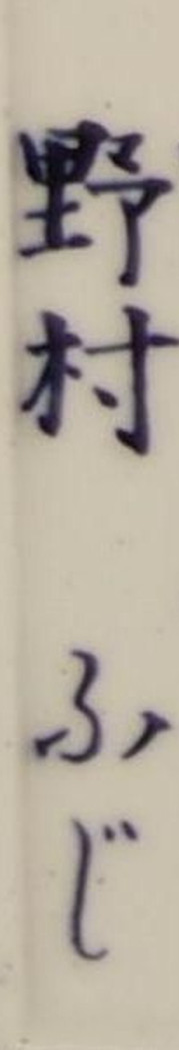野村ふじ

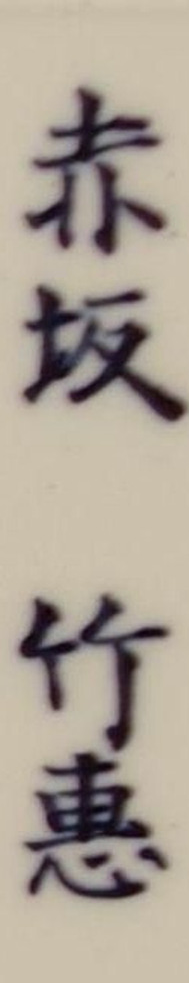赤坂竹恵
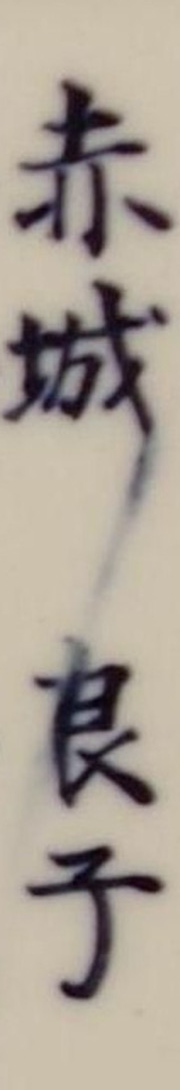赤城良子
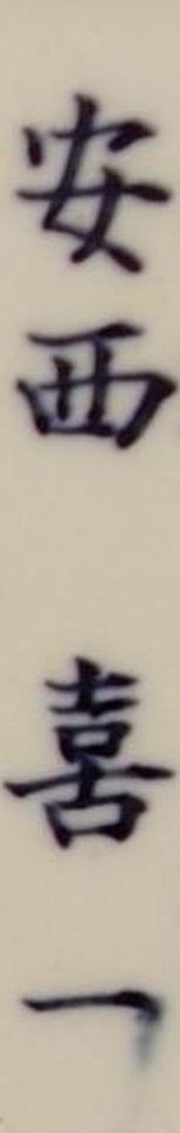安西喜一
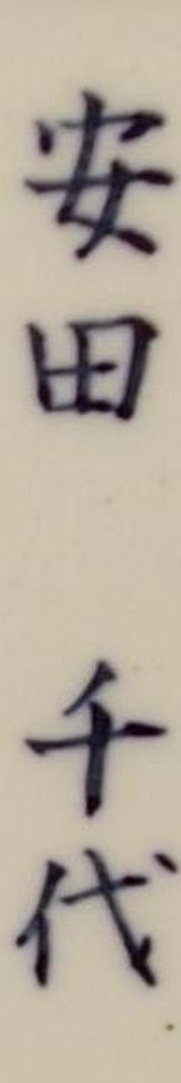安田千代
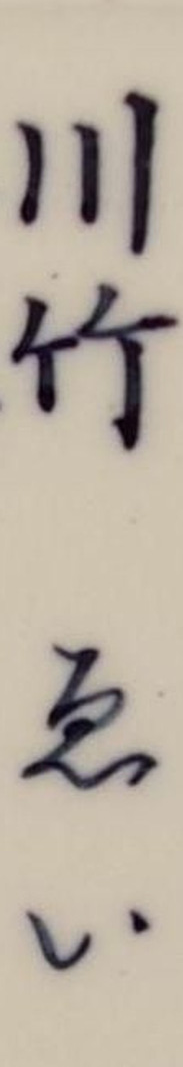川竹えい
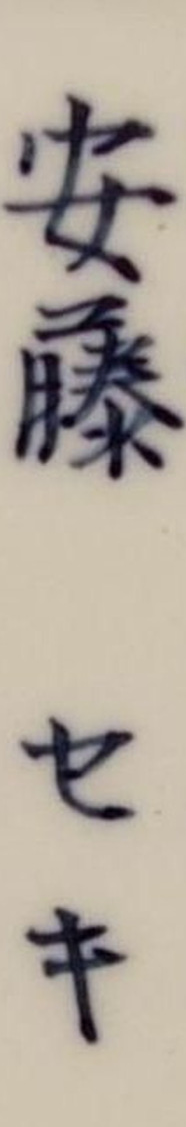安藤セキ
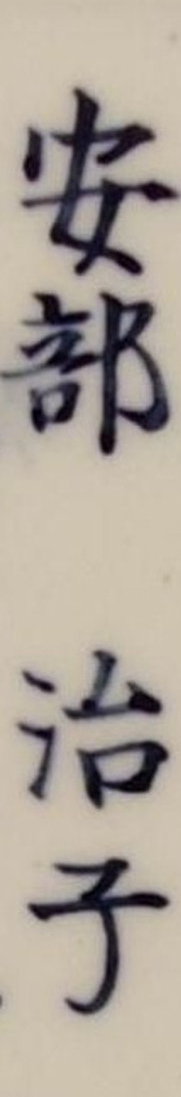安部治子
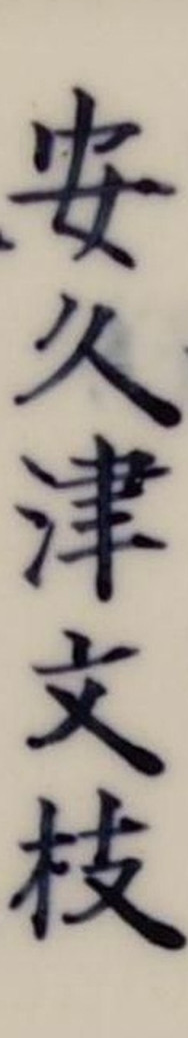安久津文枝
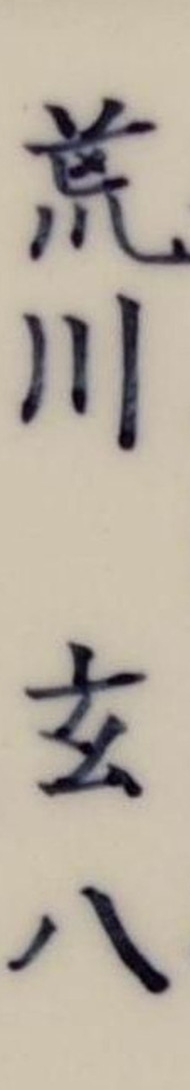荒川玄八
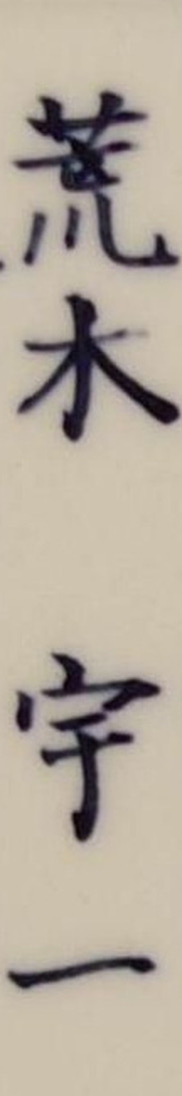荒木宇一
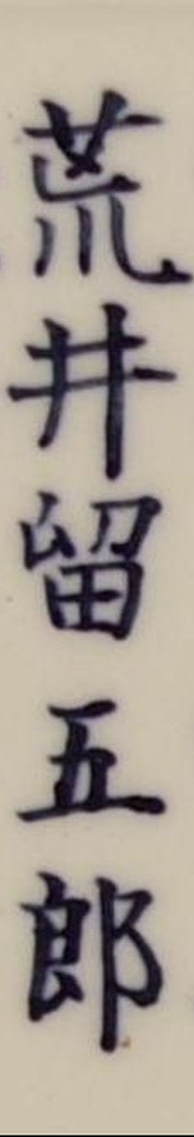荒井留五郎
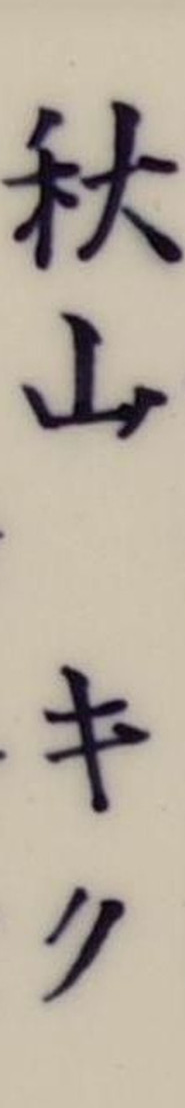秋山キク
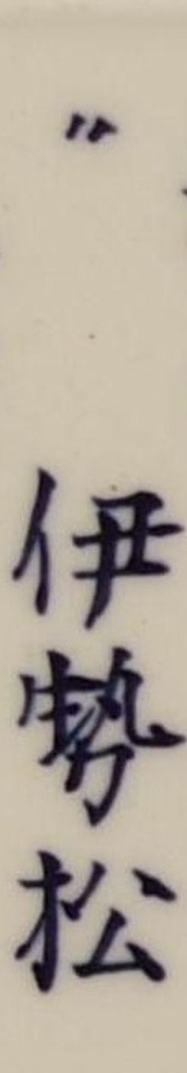伊勢松
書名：M~S
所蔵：高野山金剛峯寺
